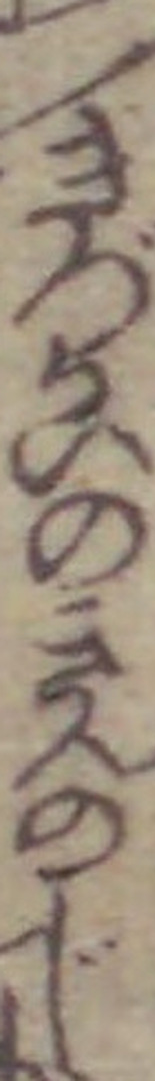きづかいのきんのじも
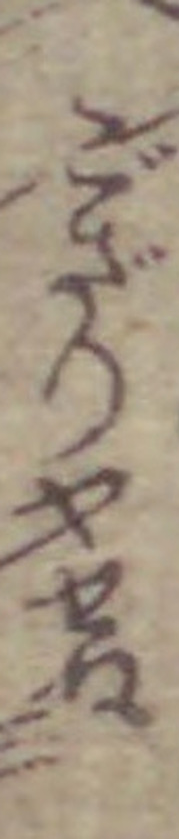ござりやせぬ

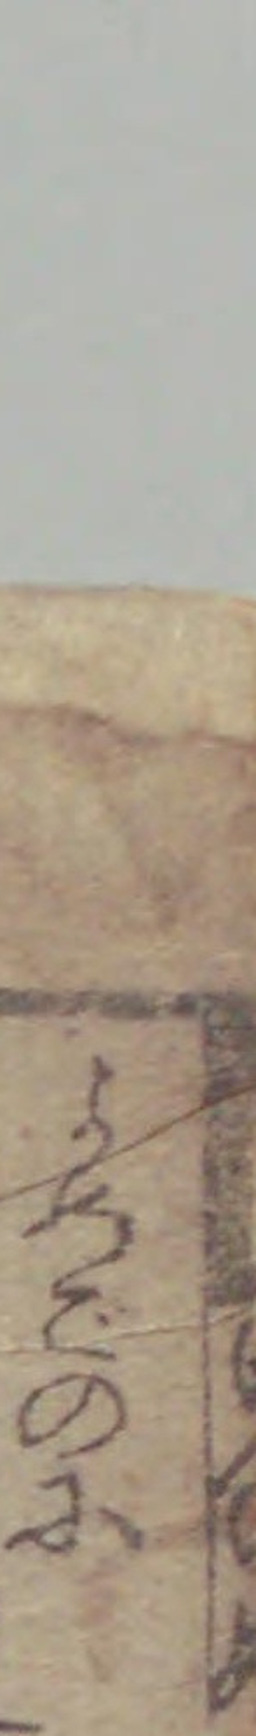よめごのに
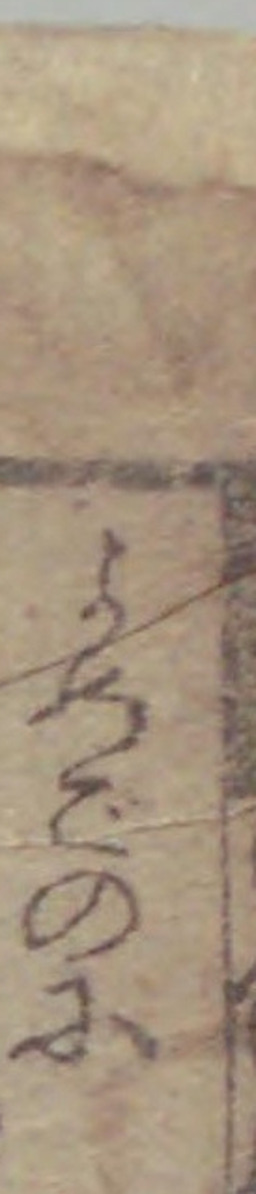よめごのに
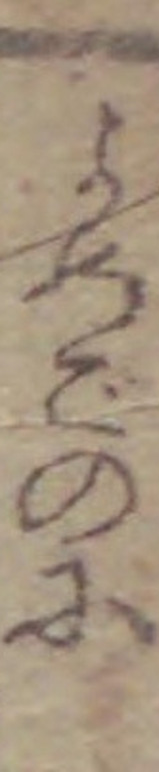よめごのに
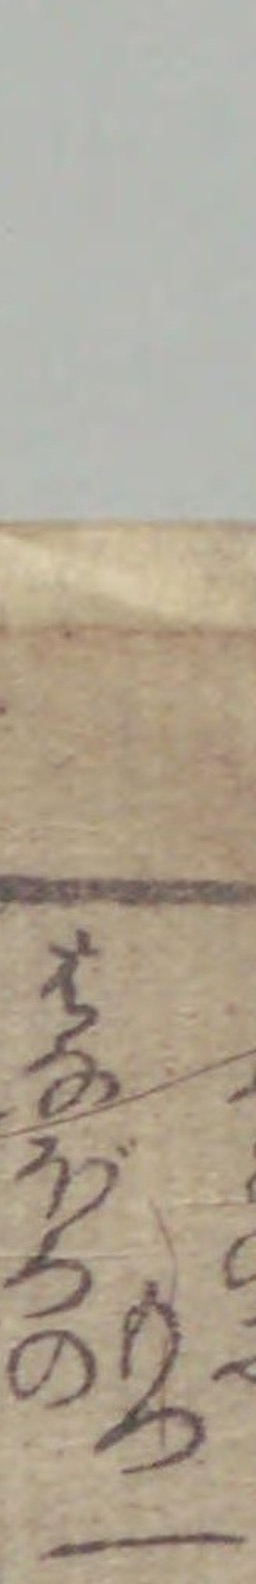はなぶちの
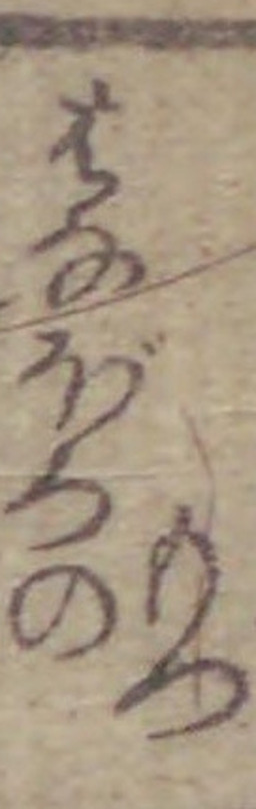はなぶちの
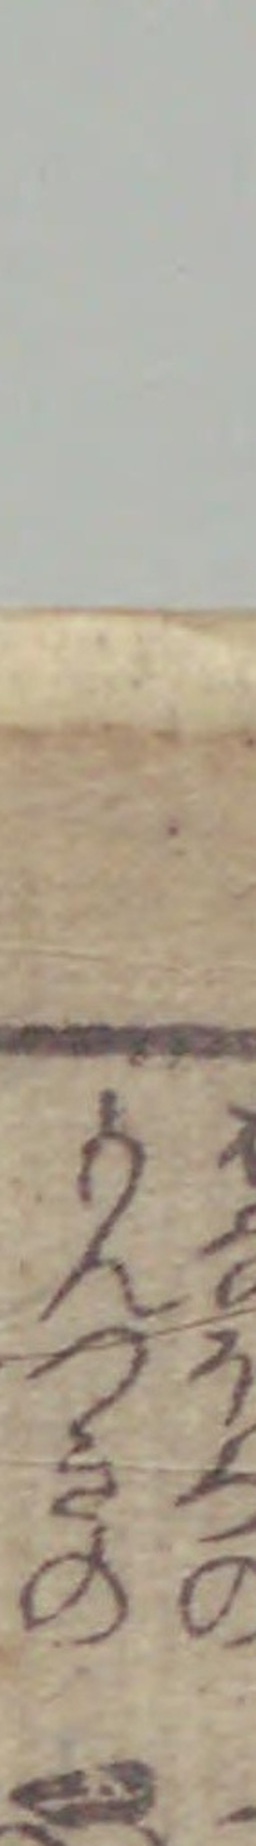もんつきの
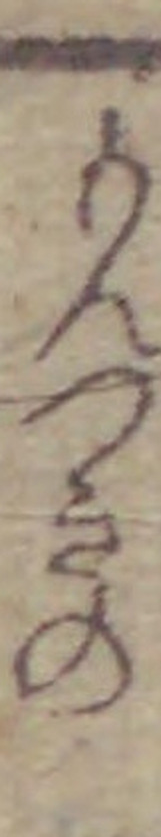もんつきの
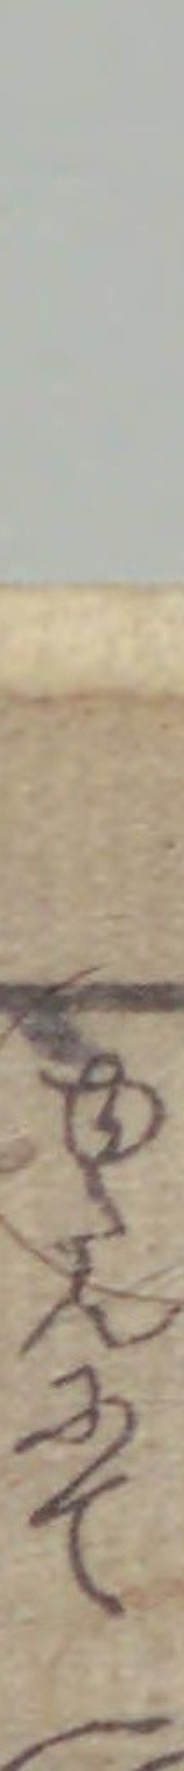ゆたんにて
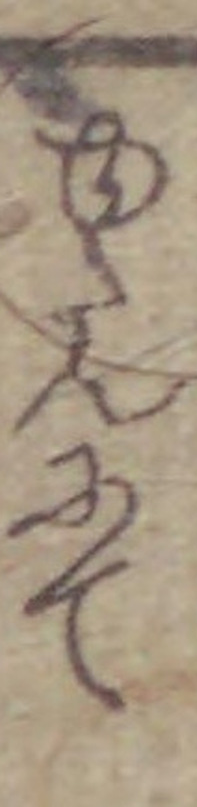ゆたんにて
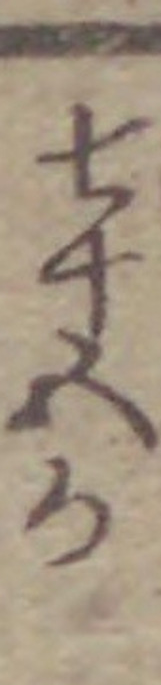七千五か
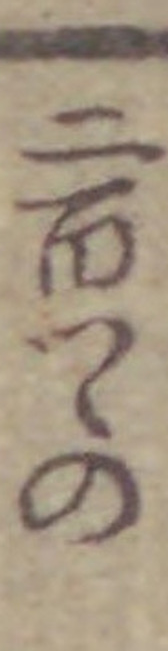二百つゝの
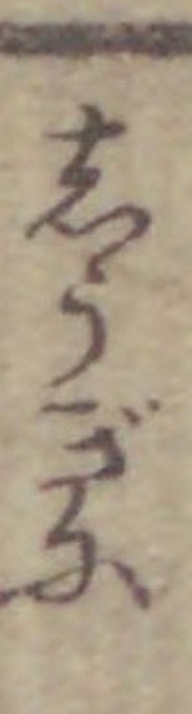しうぎに
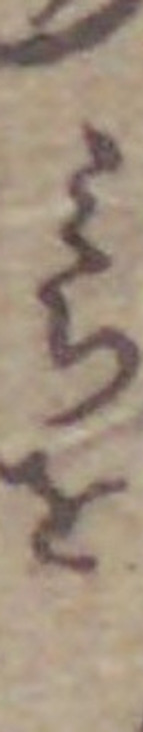みちを
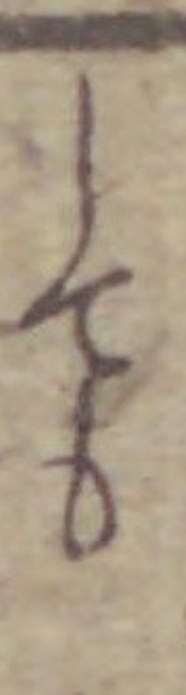しても
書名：狆の嫁入 2巻
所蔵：国立国会図書館 National Diet Library, JAPAN
